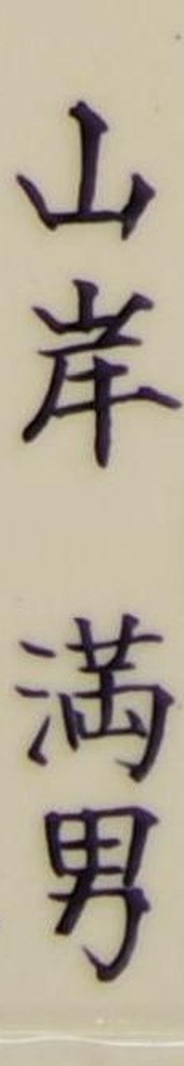山岸満男
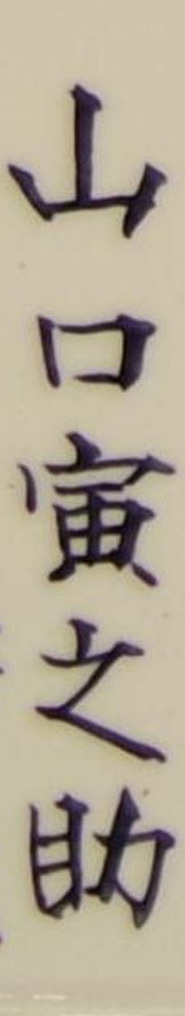山口寅之助

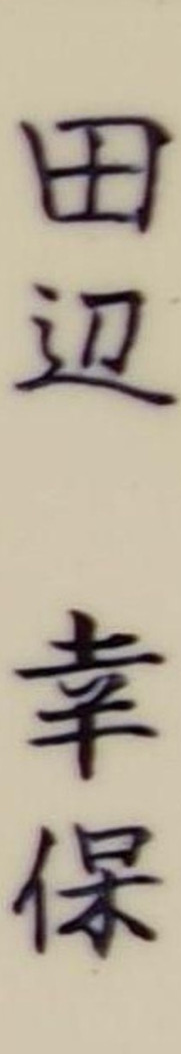田辺幸保
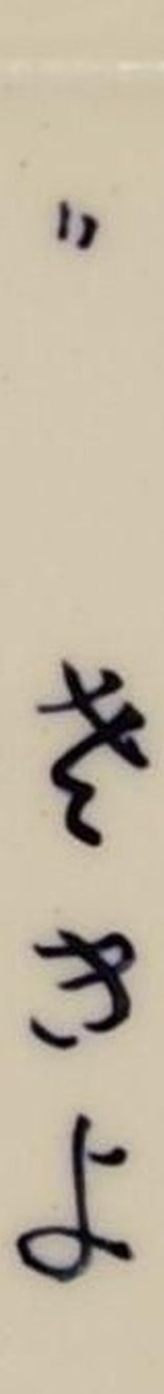さきよ
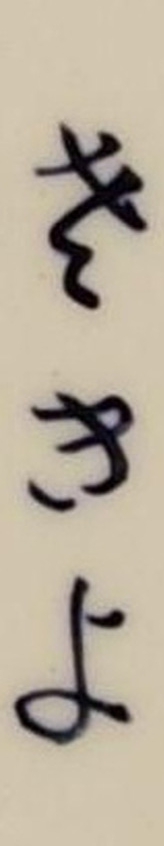さきよ
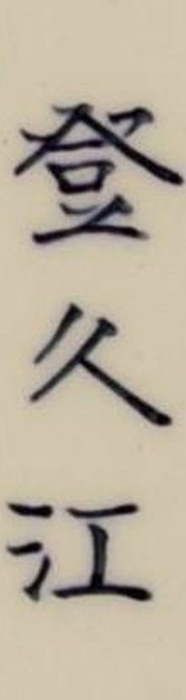登久江
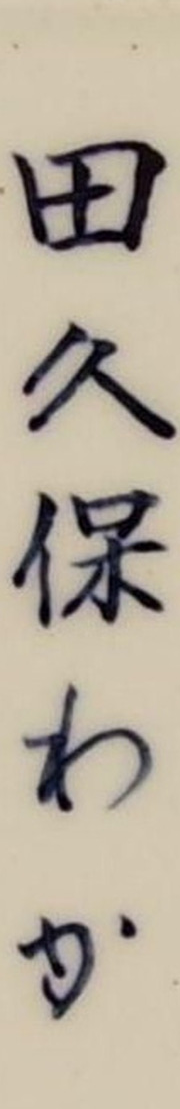田久保わか
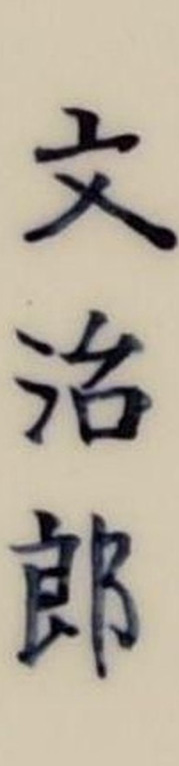文治郎
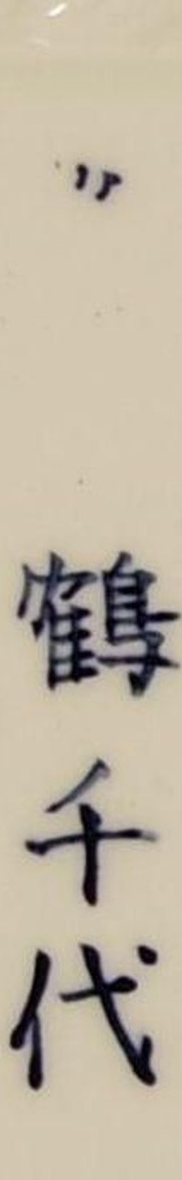鶴千代
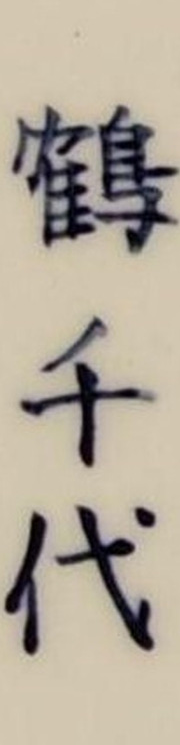鶴千代
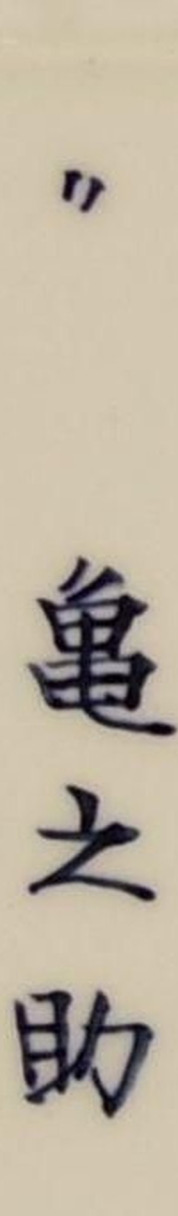亀之助
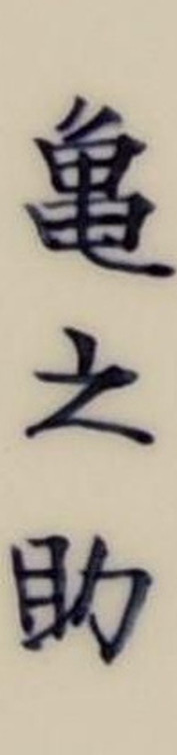亀之助
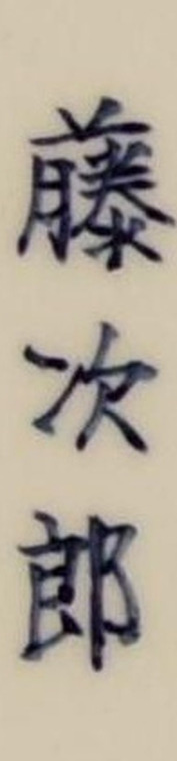藤次郎
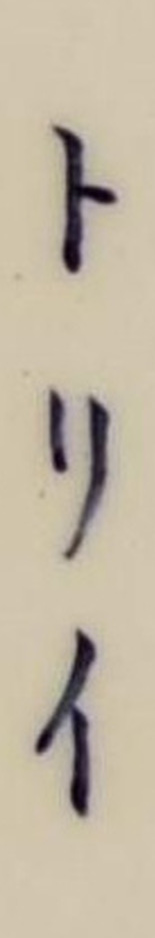トリイ
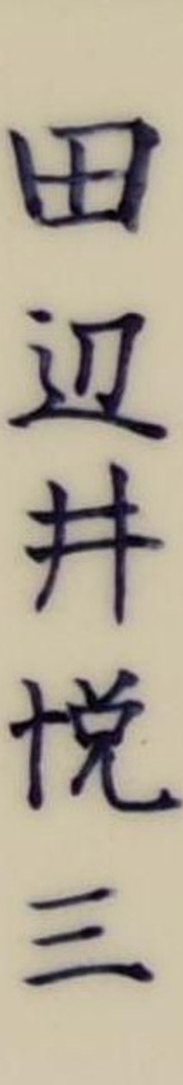田辺井悦三
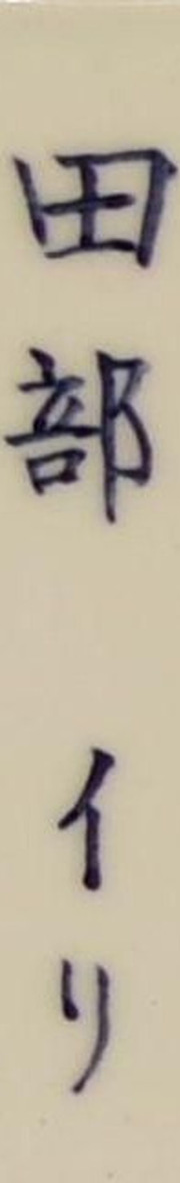田部イリ
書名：A~D
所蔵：koyasan kongobuji
